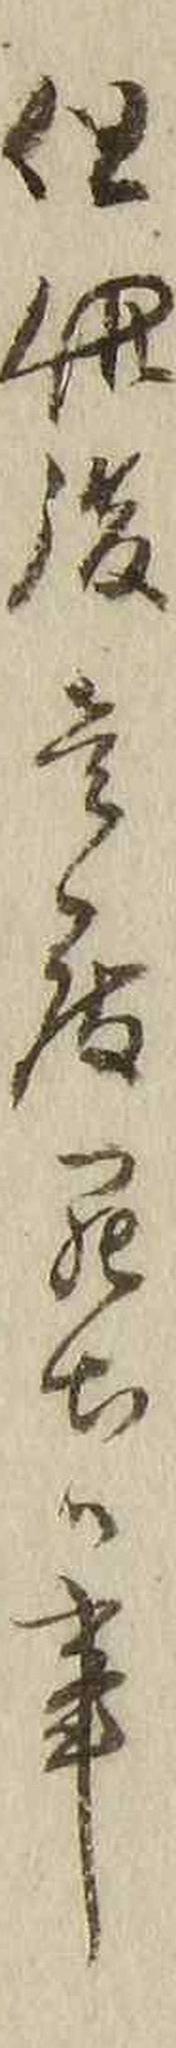但此後壱度罷出候事
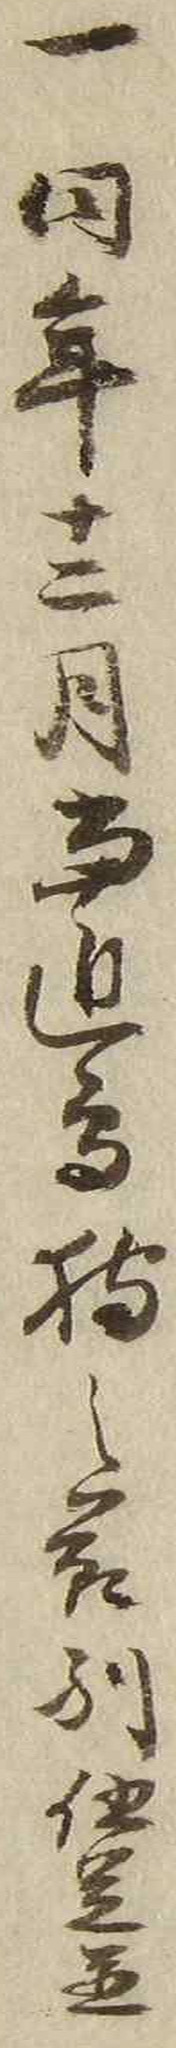一同年十二月当追鳥狩之節列伍足並
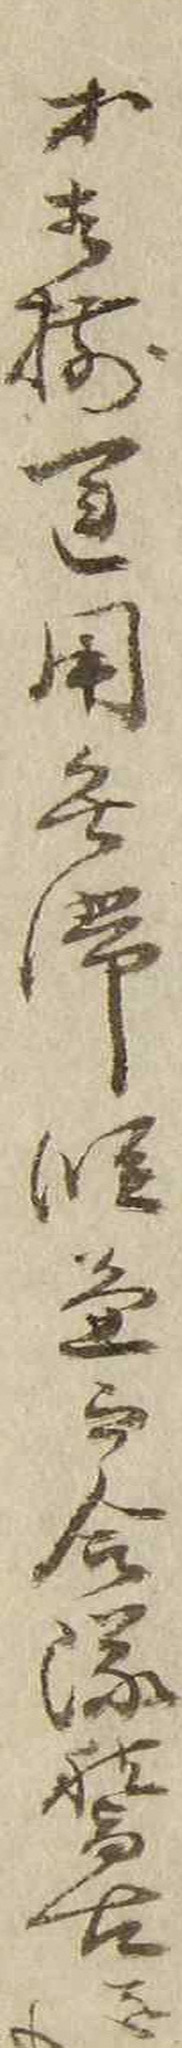等相揃運用無滞段兼而合隊稽古をも

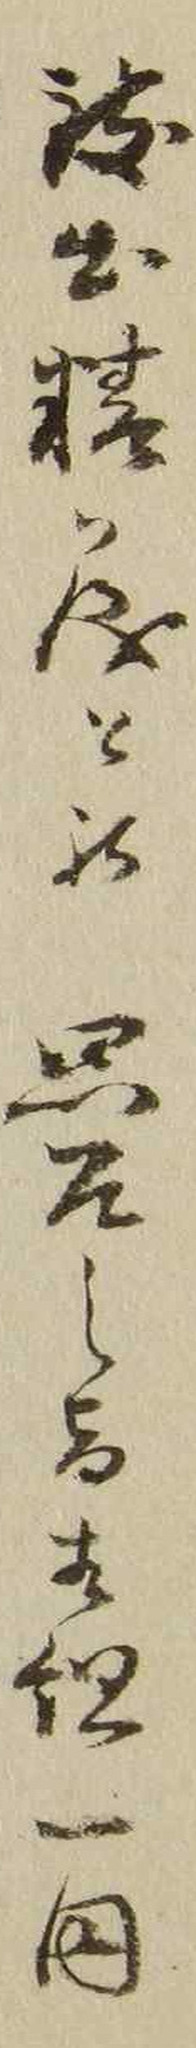致出精候儀と被思召之旨相組一同
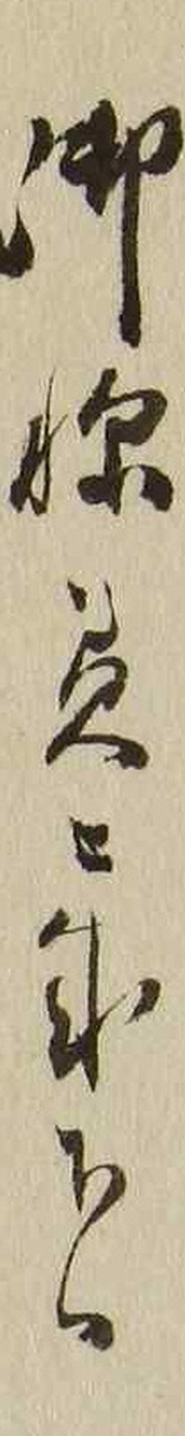御称美被成下候
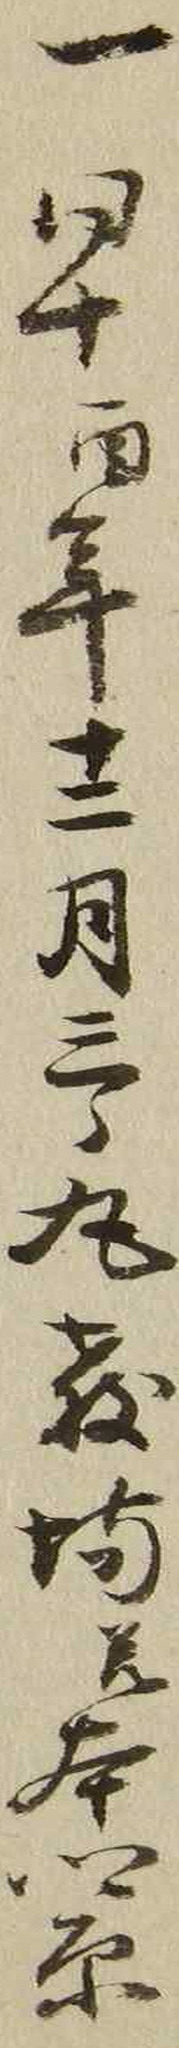一同十酉年十二月三ノ丸教場并本郷原
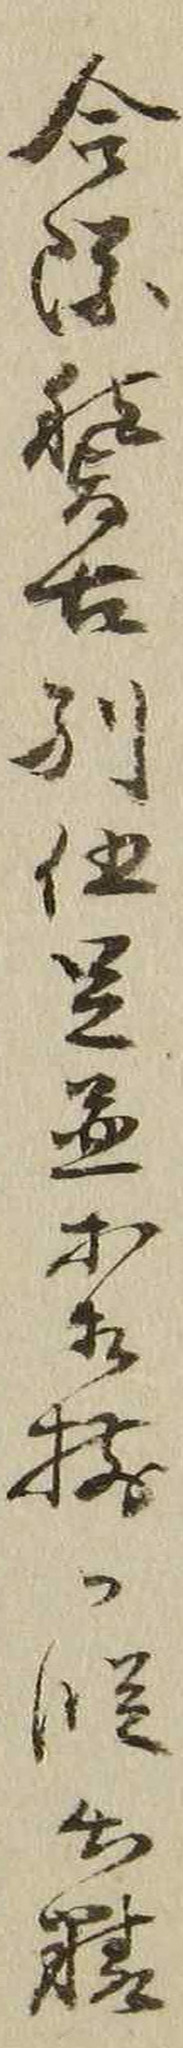合隊稽古列伍足並等相揃候段出精
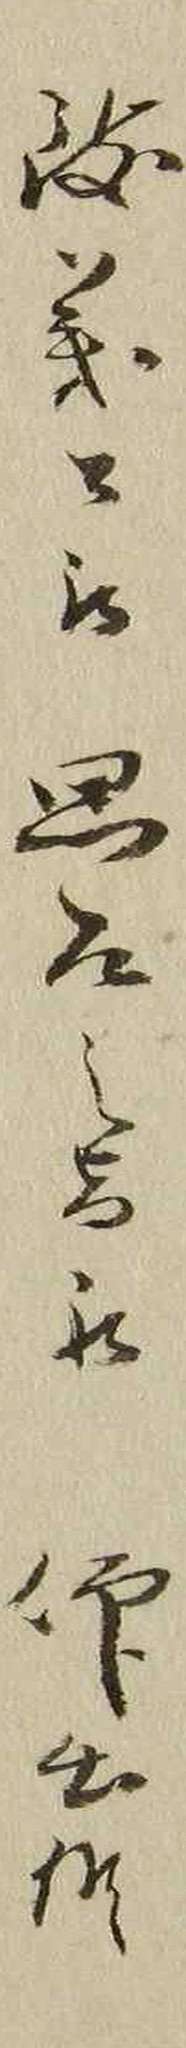致候義と被思召之旨被仰出候
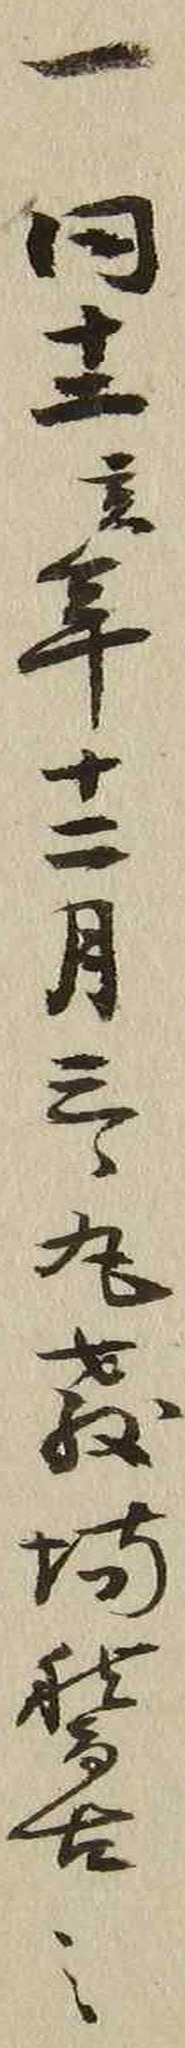一同十二亥年十二月三ノ丸場稽古之
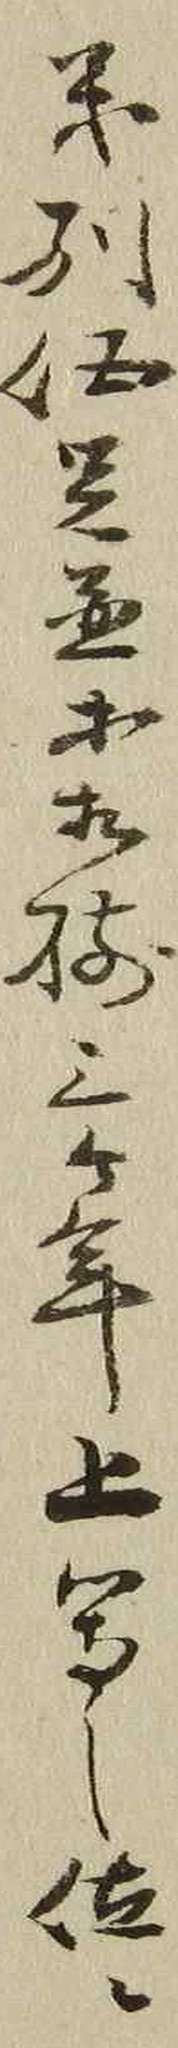義列伍足並等相揃三ケ年上等之位ニ
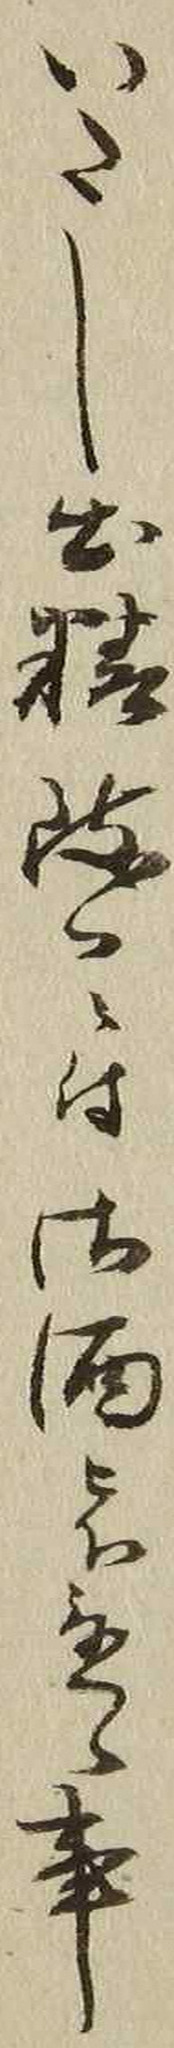いたし出精候ニ付御酒被下置候事
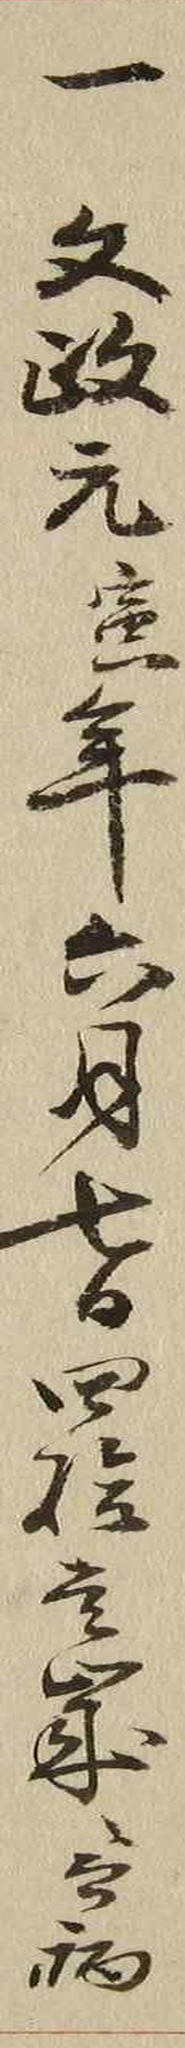一文政元寅年六月七日四拾壱歳ニ而病
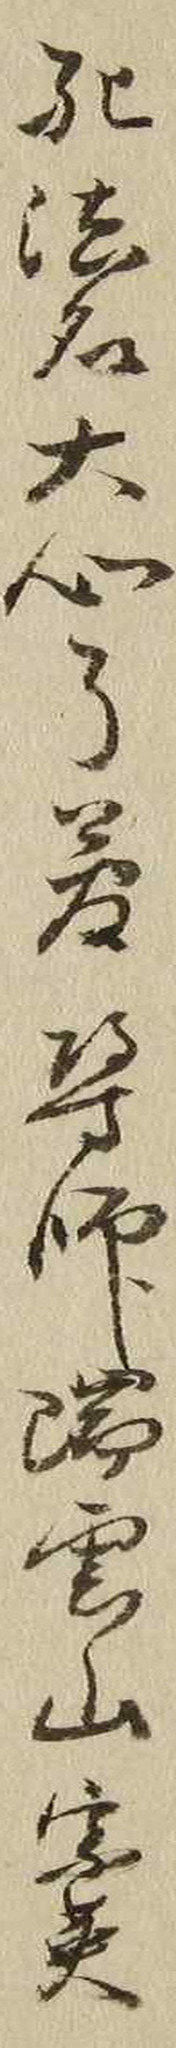死法名大心了夢導師瑞雲山宗英
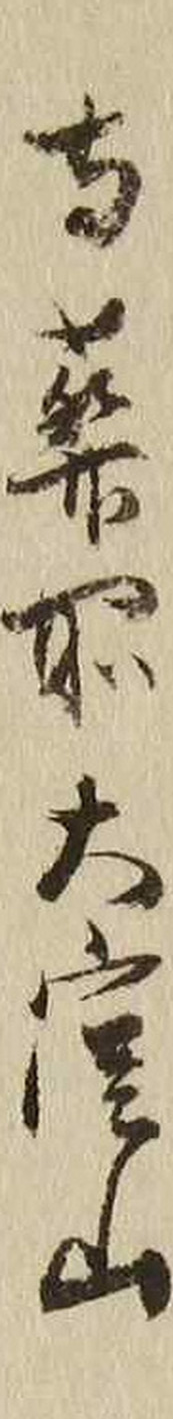寺葬所大窪山
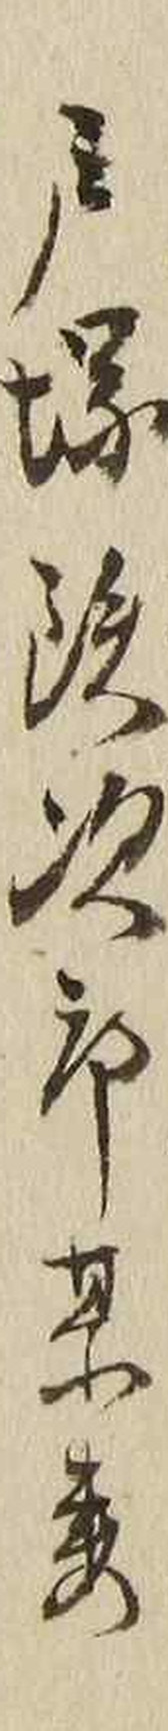戸塚鉄次郎某妻
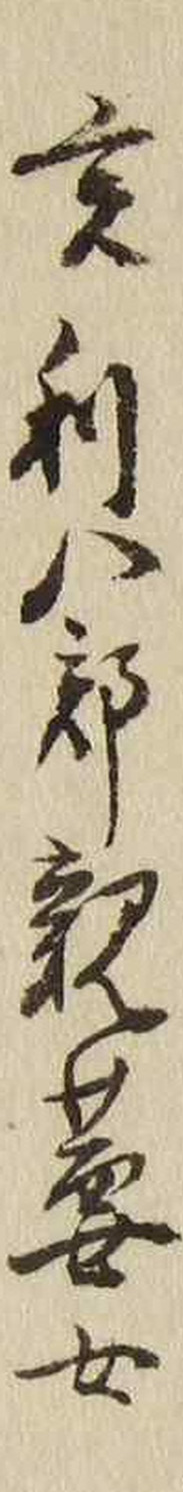実利八郎親葽女
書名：諸士系譜　巻之232　け之部1
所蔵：会津若松市立会津図書館
